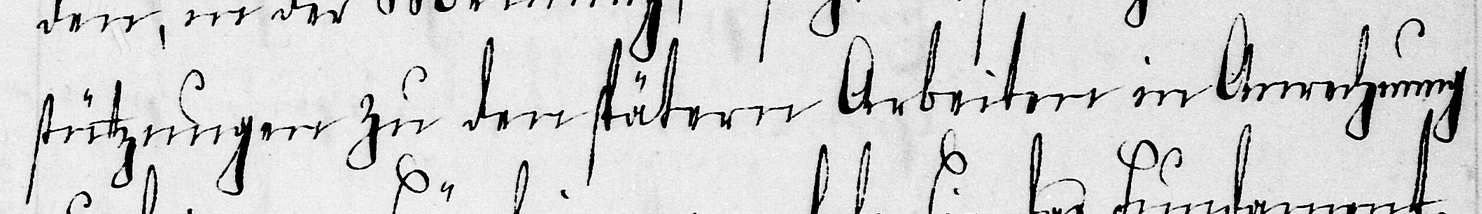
stützungen zu den spätern Arbeiten in Anrechnung
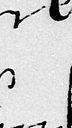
§.
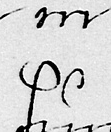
3.
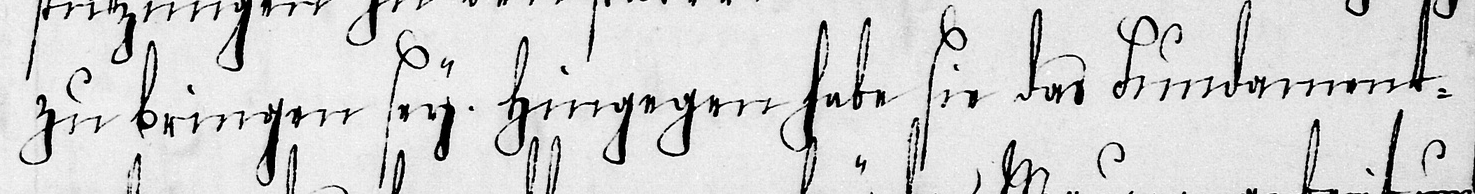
zu bringen sey. Hingegen habe sie das Fundament¬
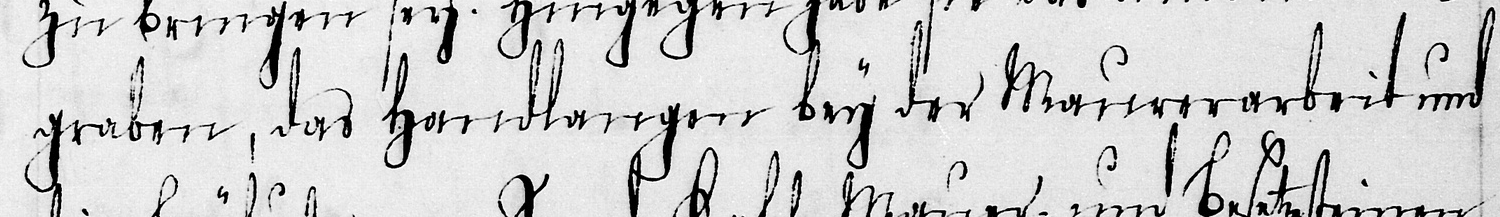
graben, das Handlangen bey der Maurerarbeit und
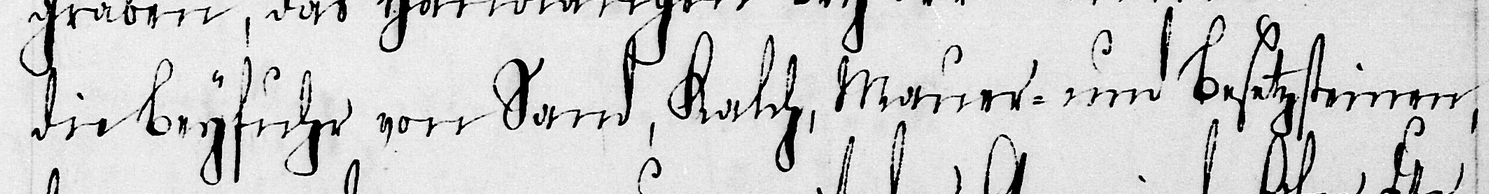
die Beyfuhr von Sand, Kalch, Mauer- und Besetzsteinen,
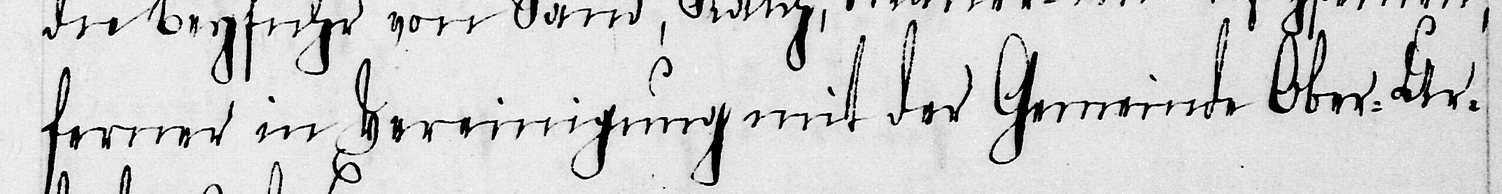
ferner in Vereinigung mit der Gemeinde Ober-Ur¬
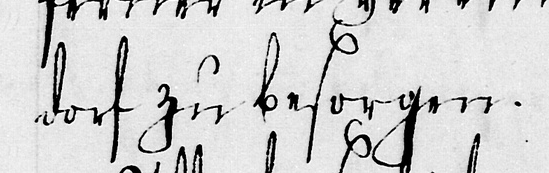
dorf zu besorgen.
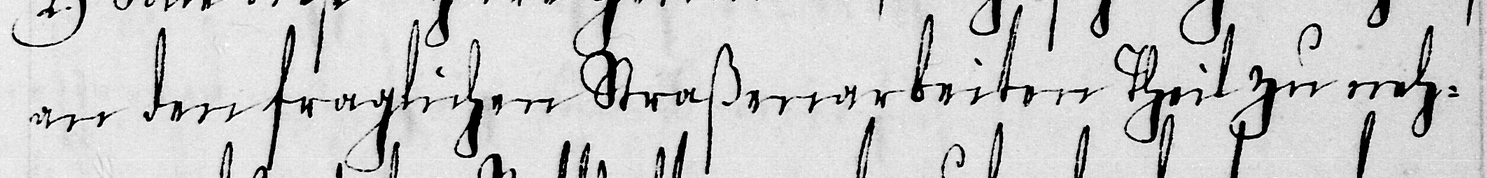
an den fraglichen Straßenarbeiten Theil zu neh¬
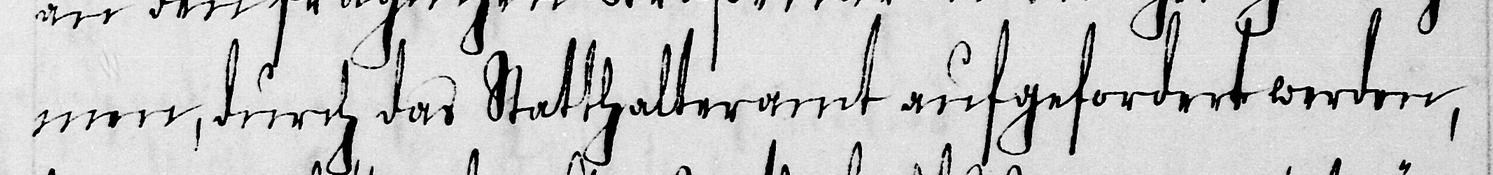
men, durch das Statthalteramt aufgefordert werden,
